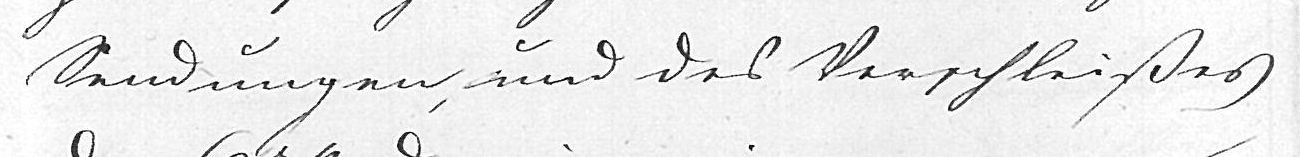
Sendungen und des Verschleißes
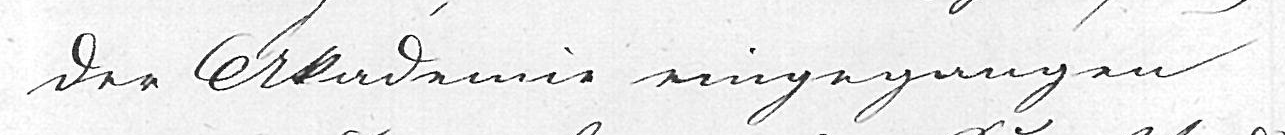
der Akademie eingegangen
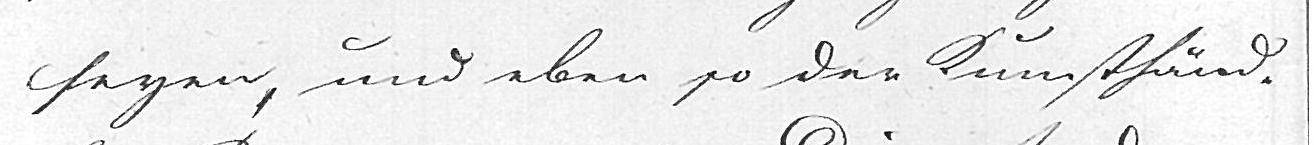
seyen, und eben so der Kunsthänd-
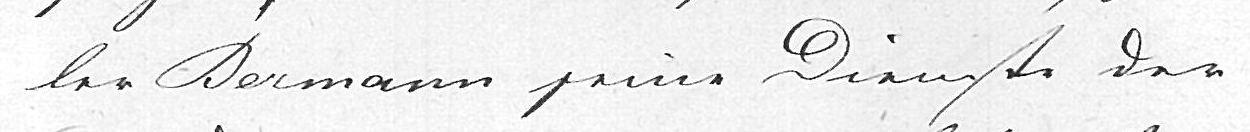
ler Bermann seine Dienste der
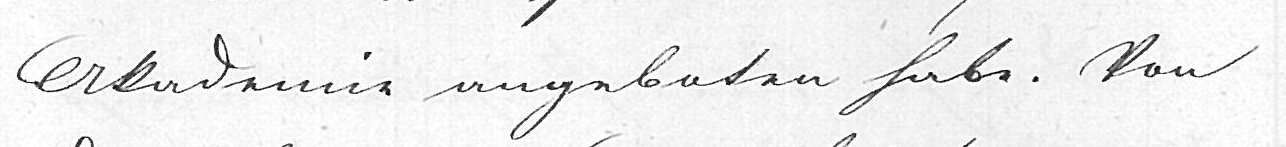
Akademie angeboten habe. Von
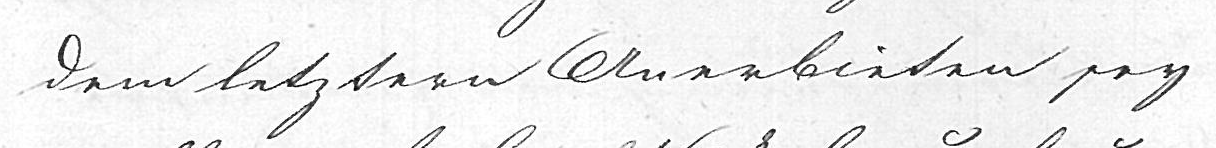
dem letzteren Anerbieten sey
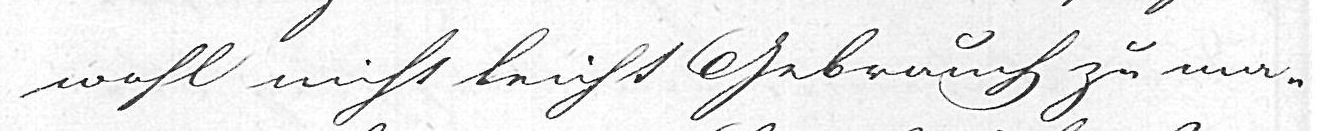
wohl nicht leicht Gebrauch zu ma-
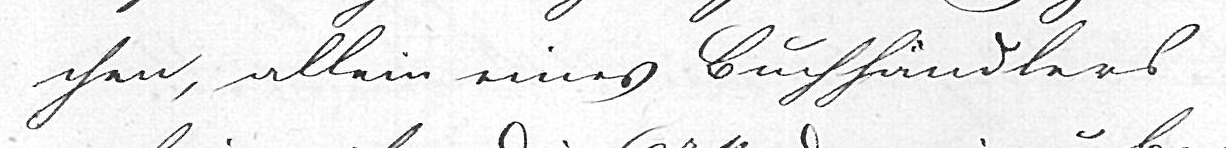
chen, allein eines Buchhändlers
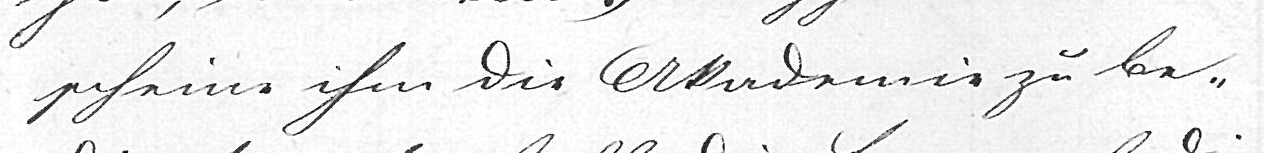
scheine ihm die Akademie zu be-
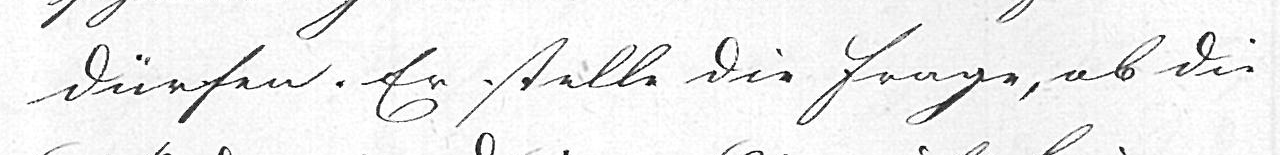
dürfen. Er stelle die Frage, ob die
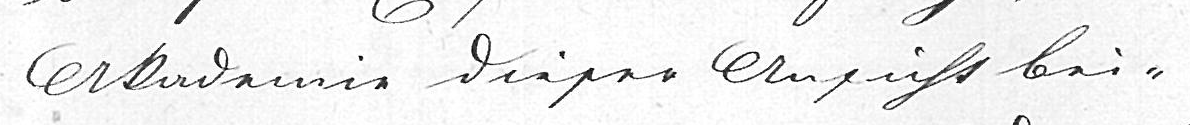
Akademie dieser Ansicht bei-
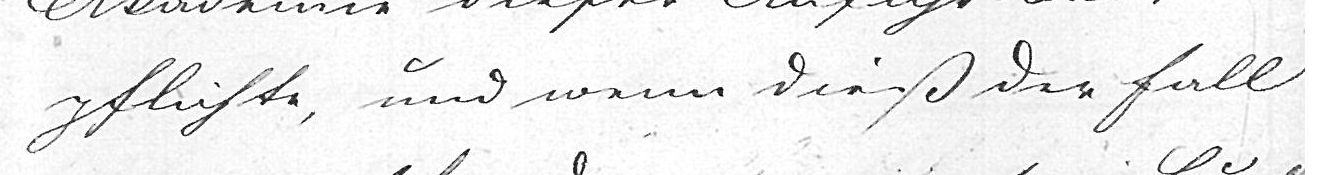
pflichte, und wenn dieß die Fall
